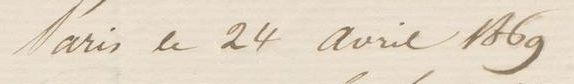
Paris le 24 Avril 1869
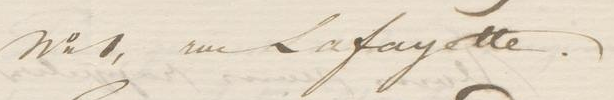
No 1, rue Lafayette.
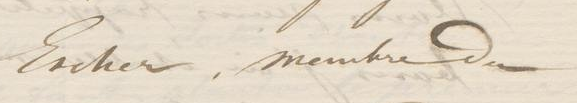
Escher, membre du
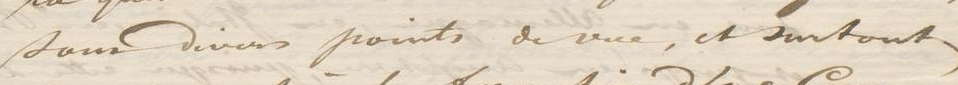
sous divers points de vue, et surtout
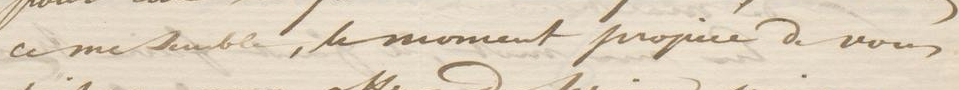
ce me semble, le moment propice de vous
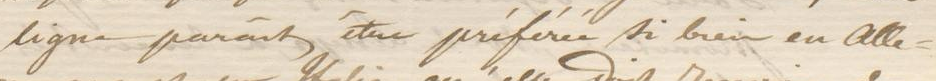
ligne paraît être préférée si bien en Alle-
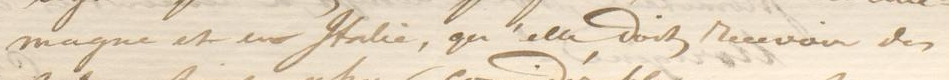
magne et en Italie, qu'elle doit recevoir des
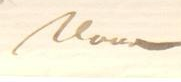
subventions
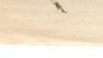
assez
